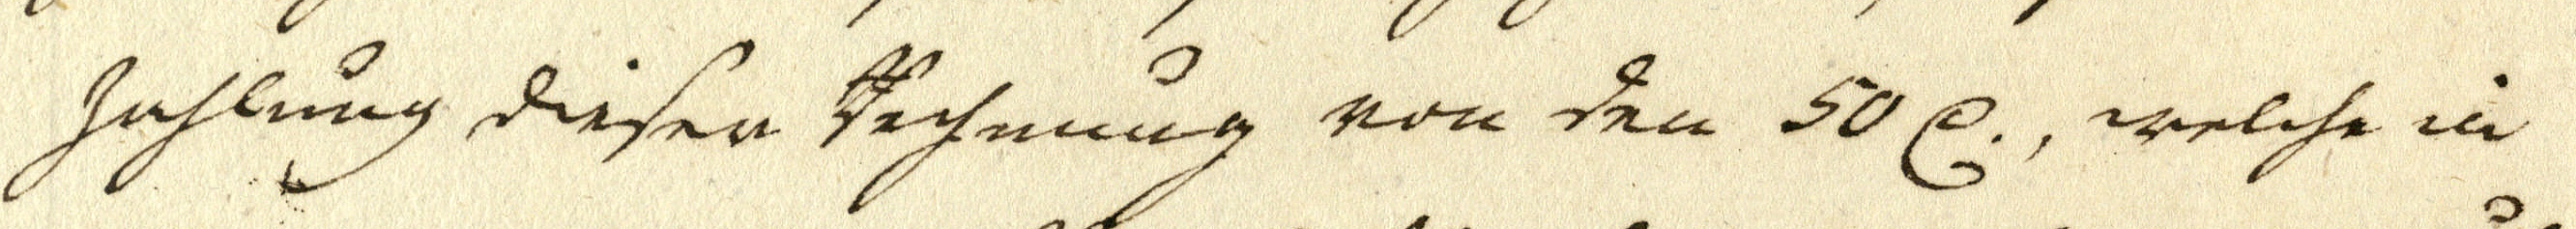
zahlung dieser Rechnung von den 50 l., welche in
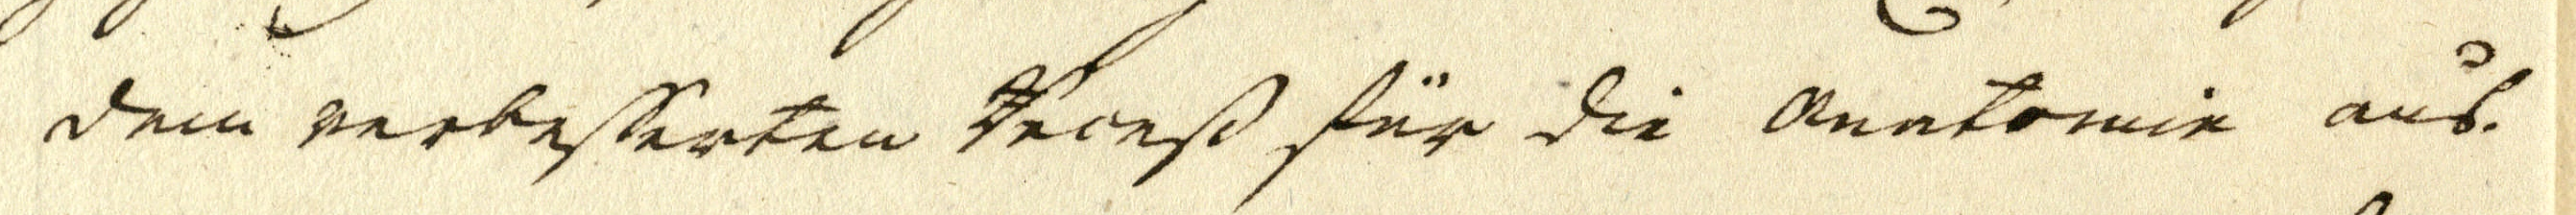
dem verbesserten Receß für die Anatomie aus¬
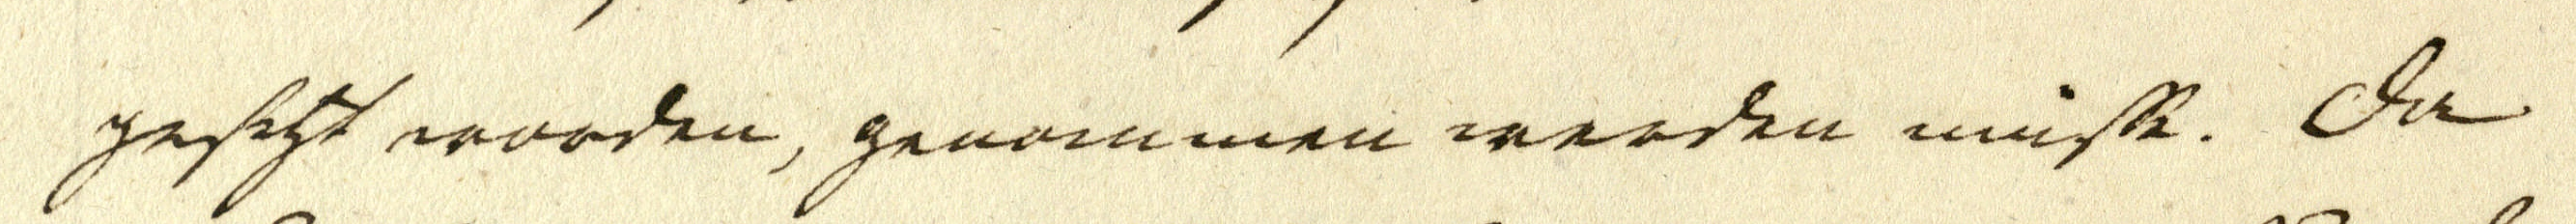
gesetzt werden, genommen werden müsse. Da
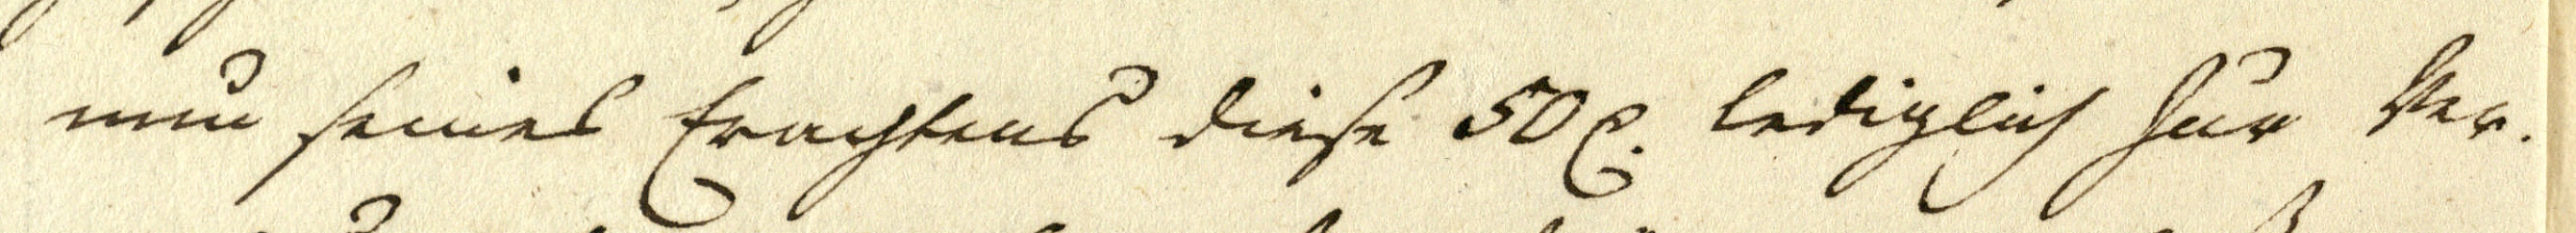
nun seines Erachtens diese 50 l. lediglich für Ver¬
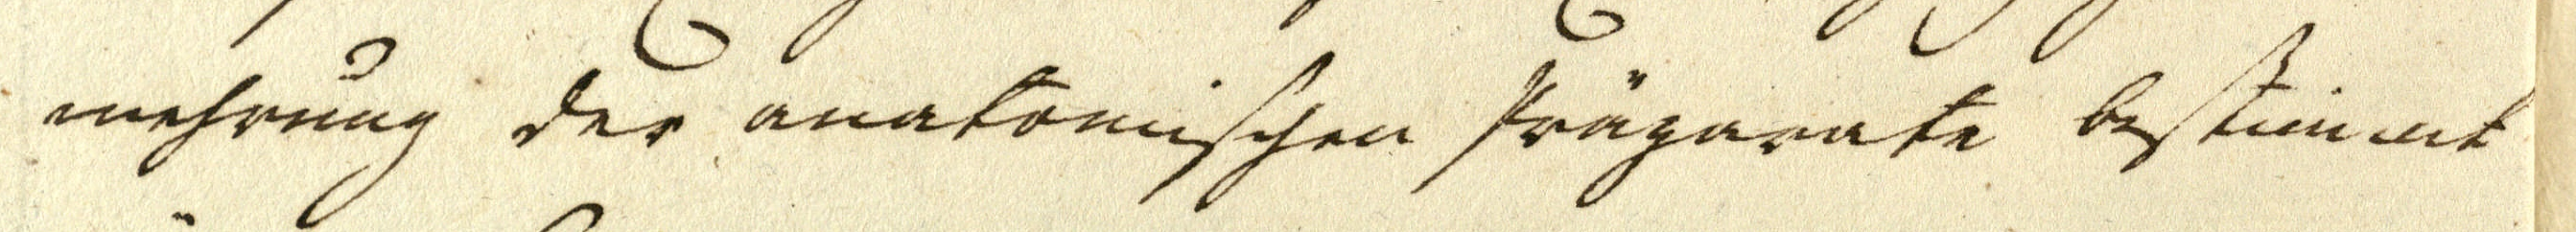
mehrung der anatomischen präparate bestimmt
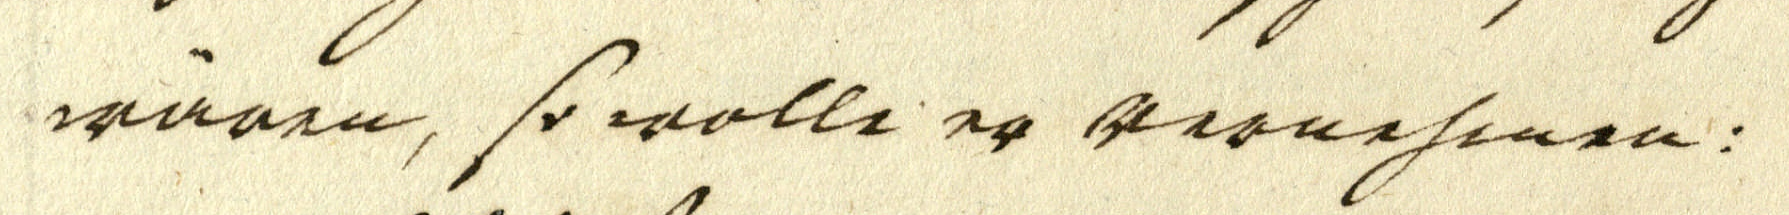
wären, so wolle er vernehmen:
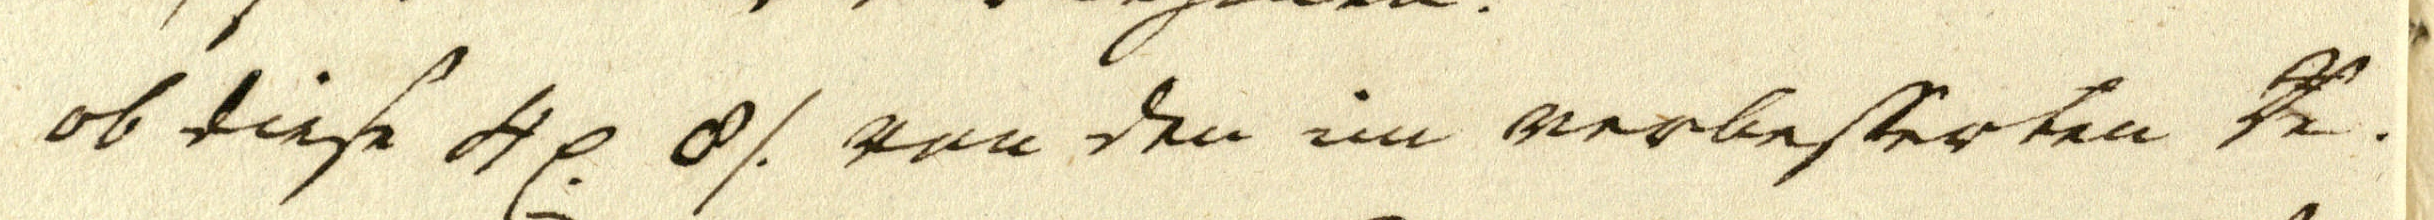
ob diese 4 l. 8 s. von den im verbesserten Re¬
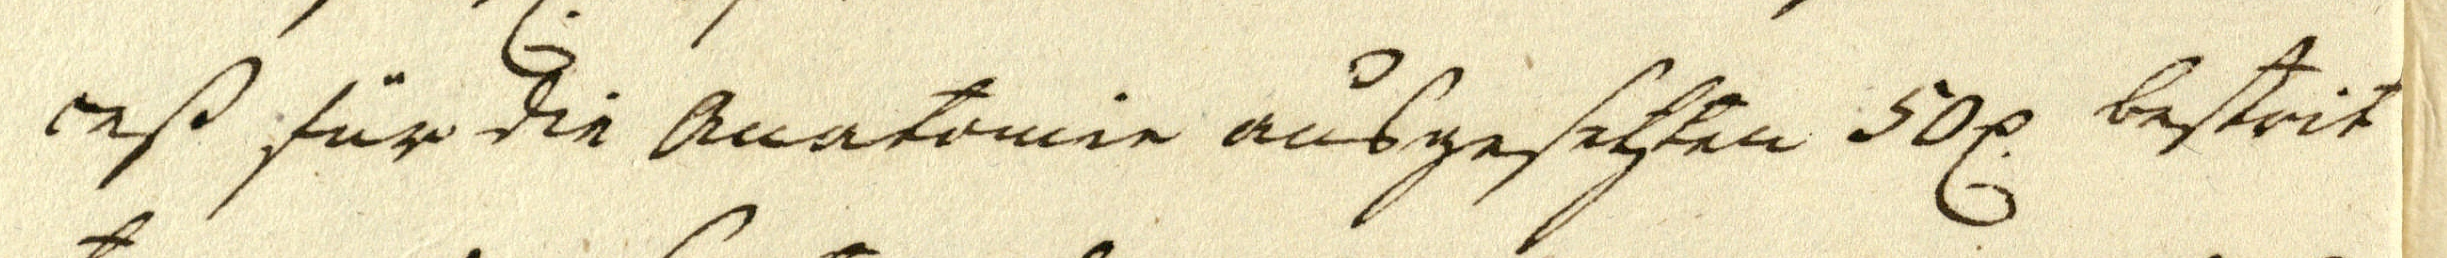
ceß für die Anatomie ausgesetzten 50 l. bestrit¬
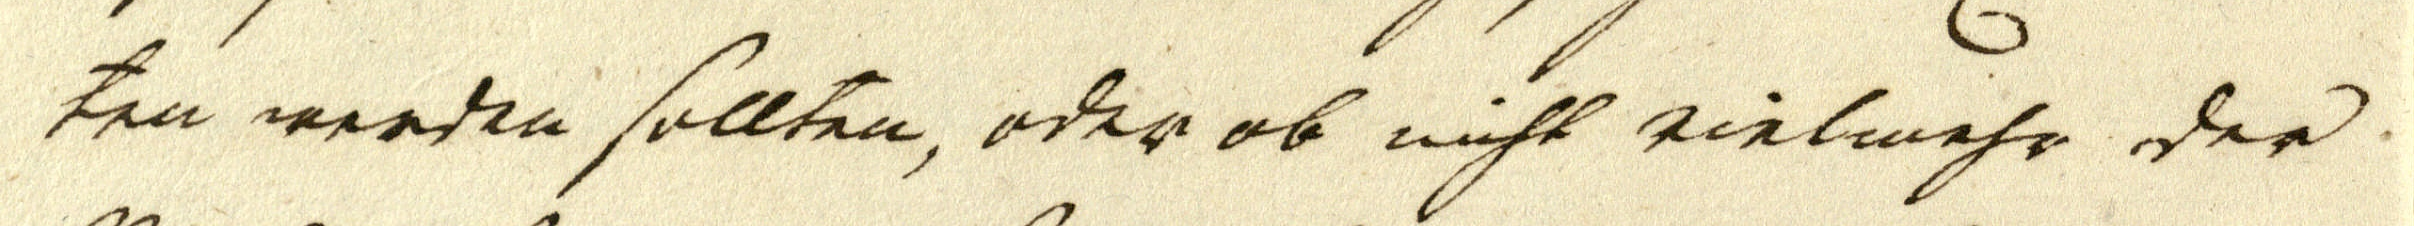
ten werden sollten, oder ob nicht vielmehr der
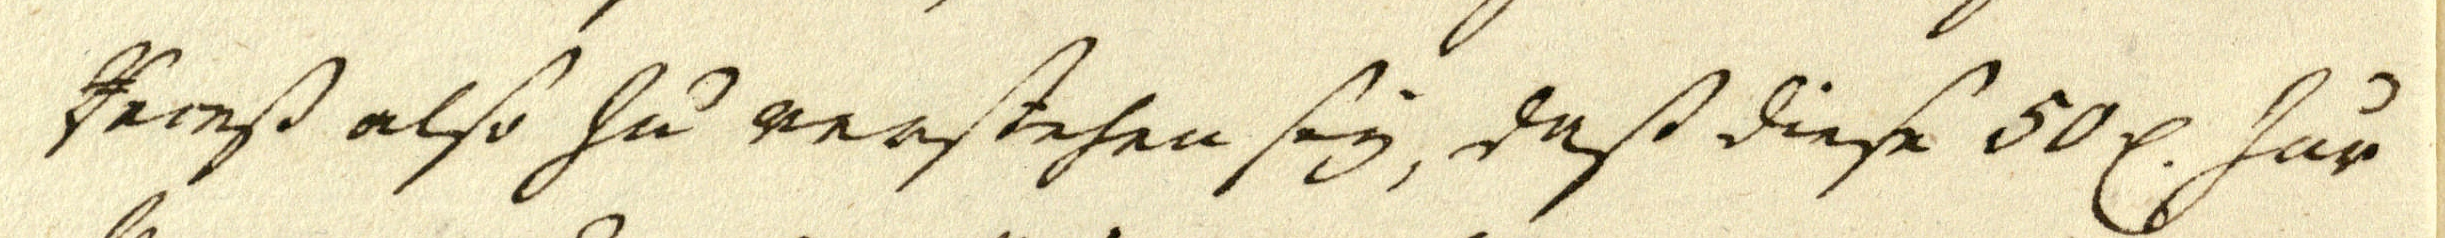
Receß also zu verstehen seÿ, daß diese 50 l. für
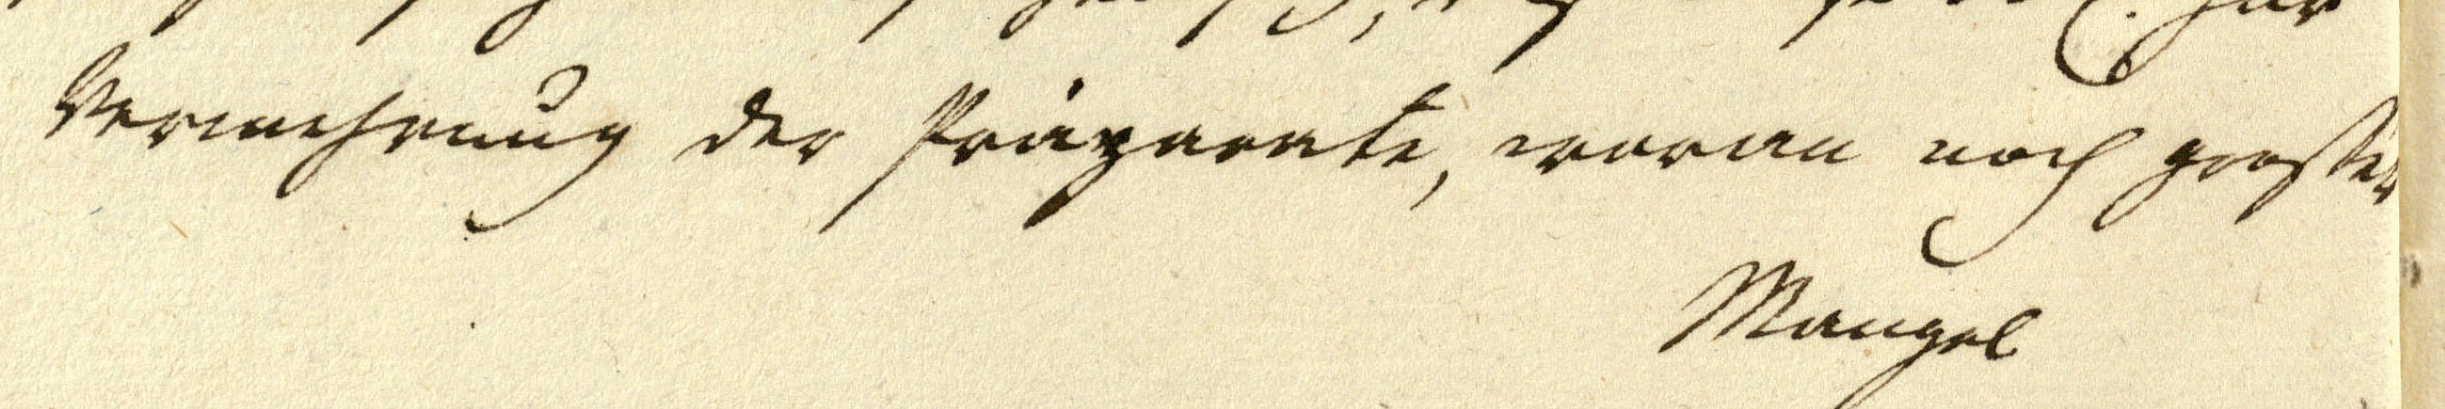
Vermehrung der Präparate, woran noch großer
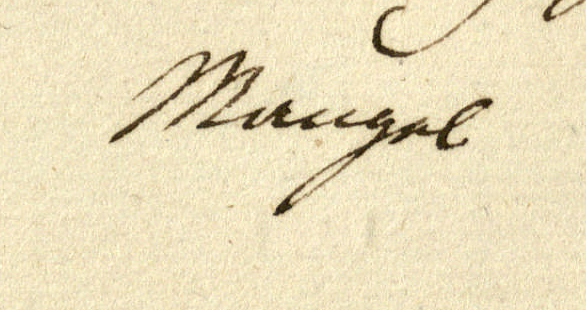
Mangel
